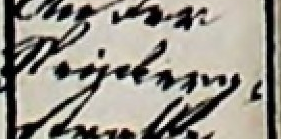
Steinberg„
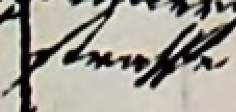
strasse
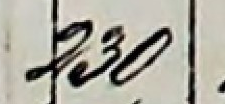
230
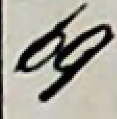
69
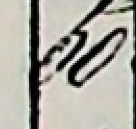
60
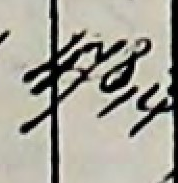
478,4
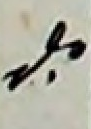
Do
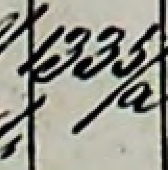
1335/a
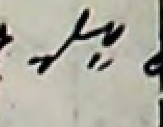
Do
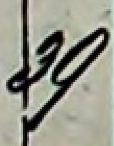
39
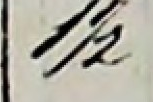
1 1/2
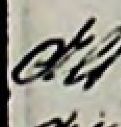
Alt
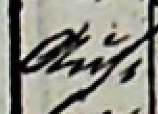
Auf„
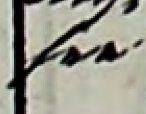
see
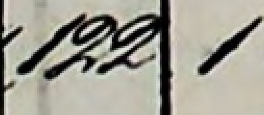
122 1
